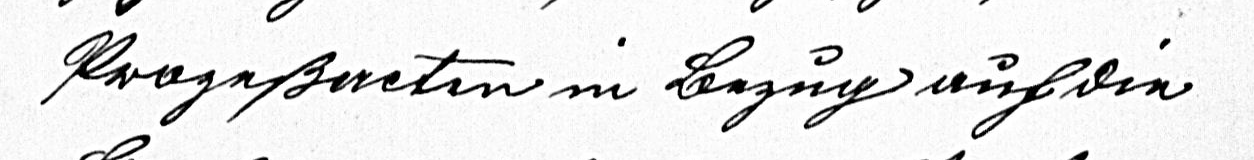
Prozeßacten in Bezug auf die
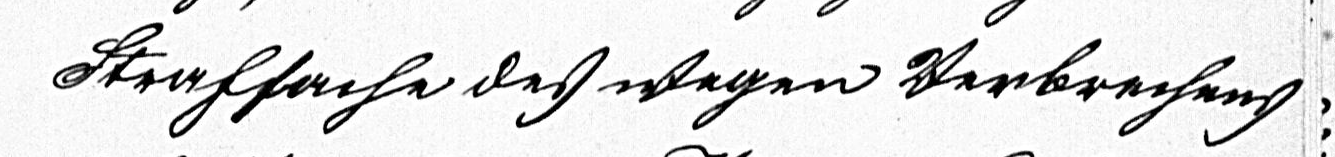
Strafsache des wegen Verbrechens
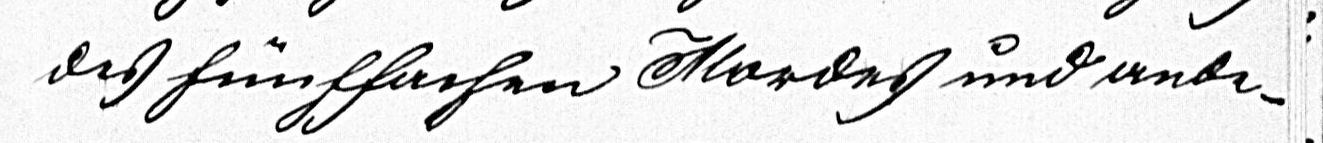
des fünffachen Mordes und ande¬
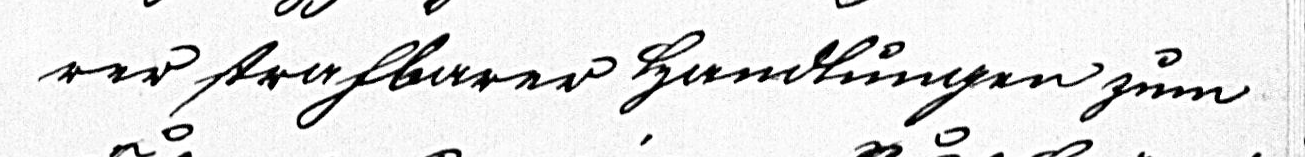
rer strafbarer Handlungen zum
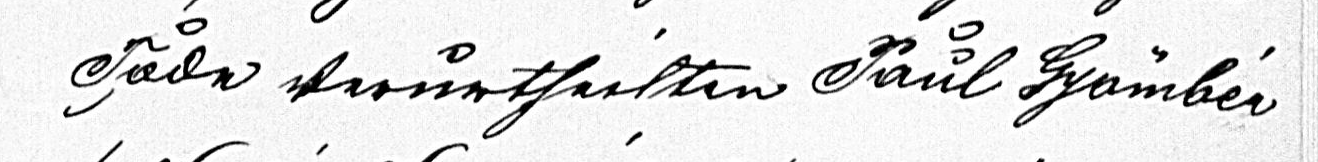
Tode Verurtheilten Paul Gyömbér
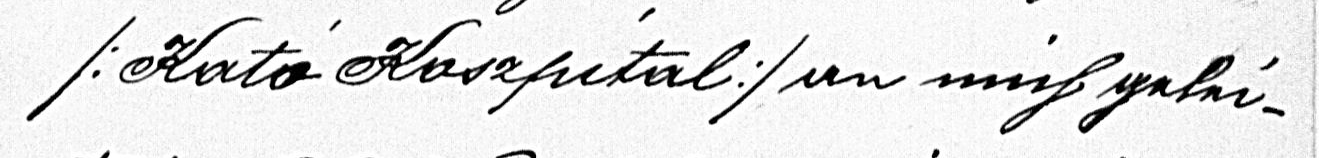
/:Kató Koszpital:/ an mich gelei¬
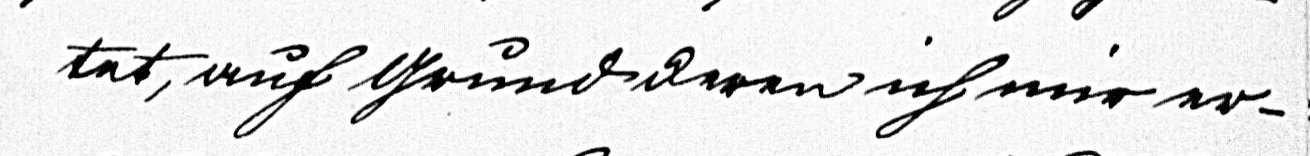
tet, auf Grund deren ich mir er¬
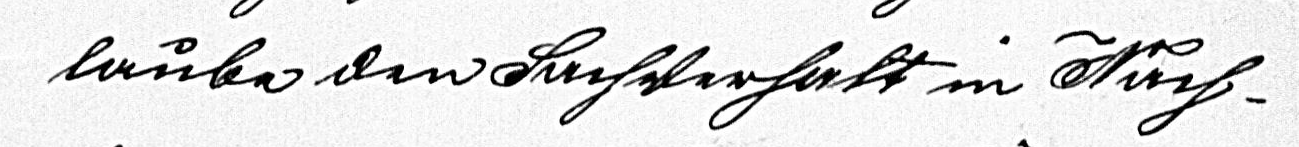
laube den Sachverhalt in Nach
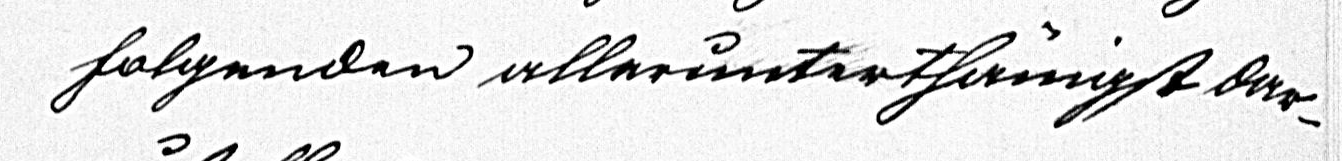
folgenden allerunterthänigst dar¬
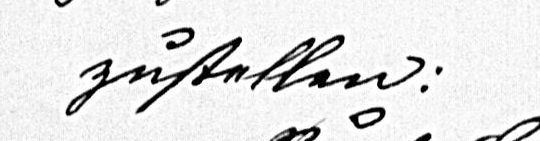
zustellen:
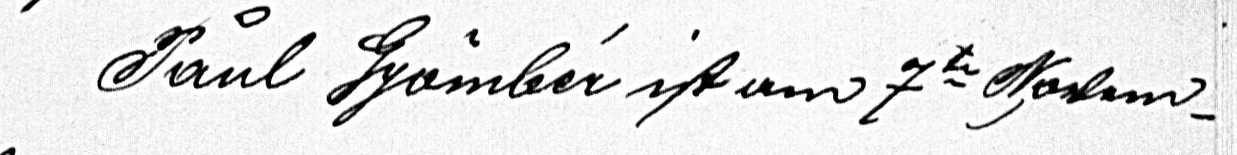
Paul Gyömbér ist am 7th Novem¬
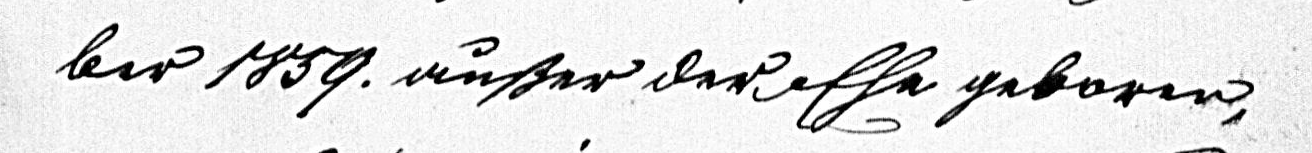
ber 1859. außer der Ehe geboren,
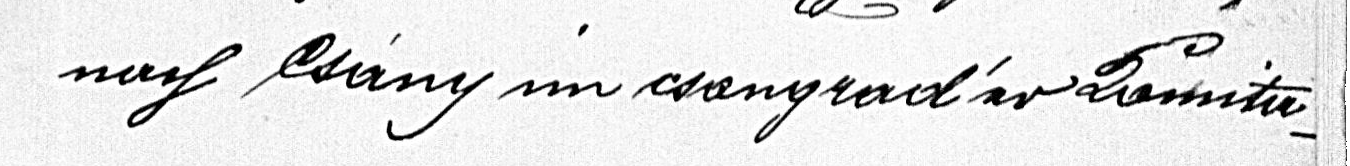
nach Csány im csangrad'er Komita
